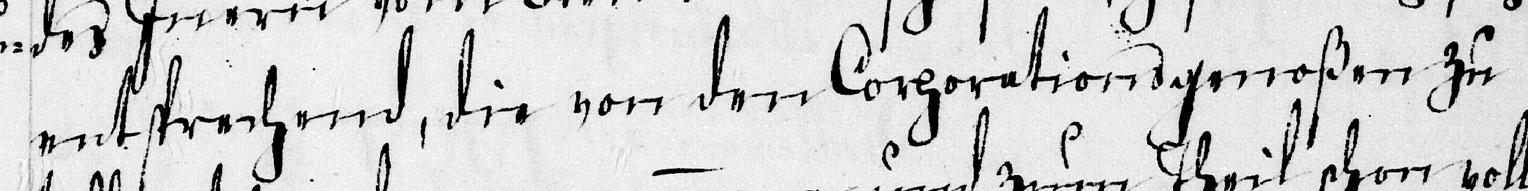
entsprechend, die von den Corporationsgenoßen zu
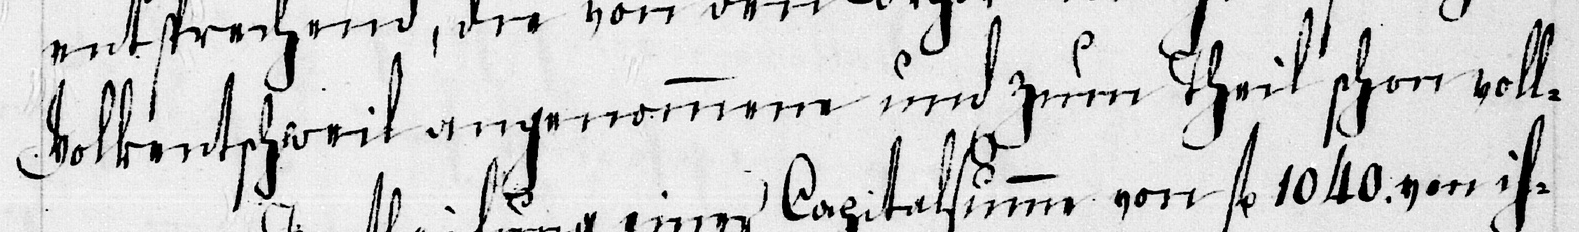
Volkentschweil angenommene und zum Theil schon voll¬
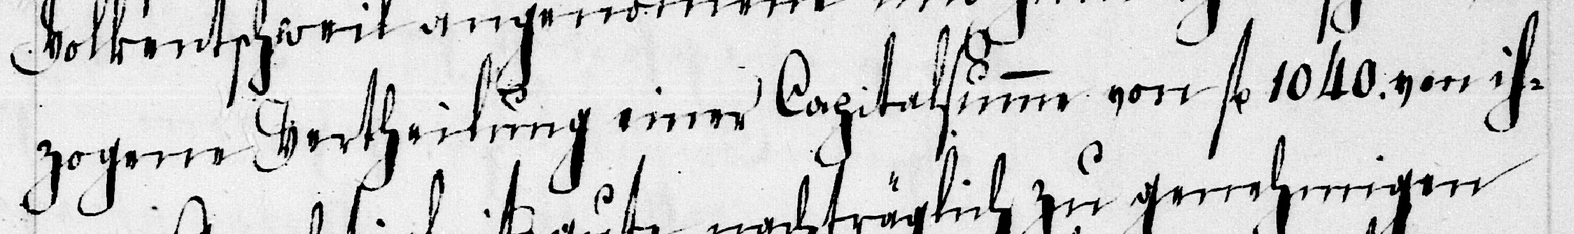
zogene Vertheilung einer Capitalsumme von fl. 1040. von ih¬
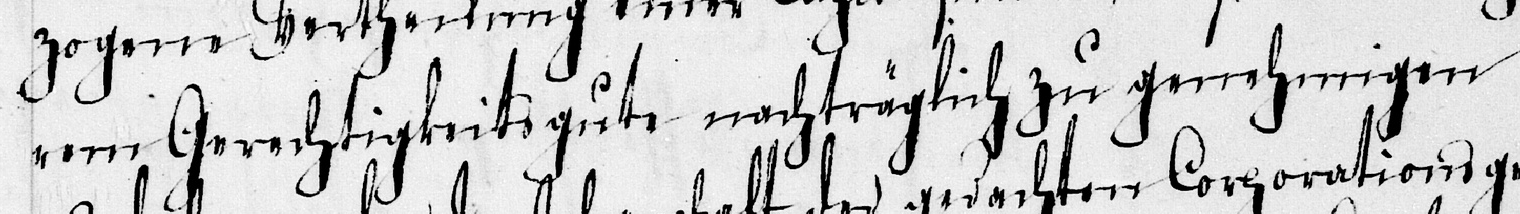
rem Gerechtigkeitsgute nachträglich zu genehmigen
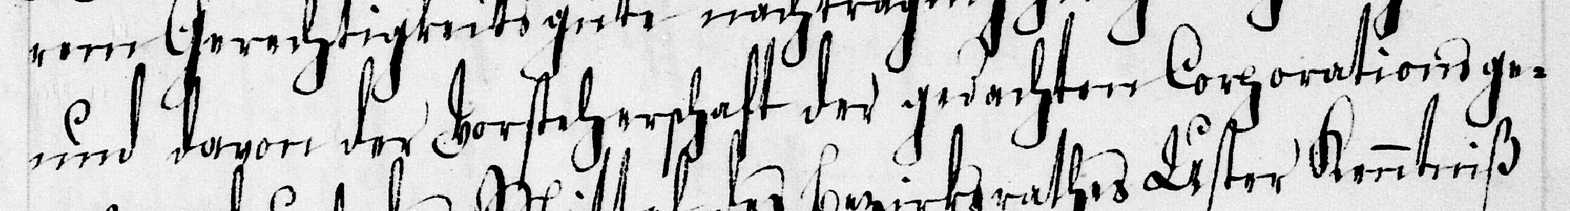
und davon der Vorsteherschaft der gedachten Corporationsge¬
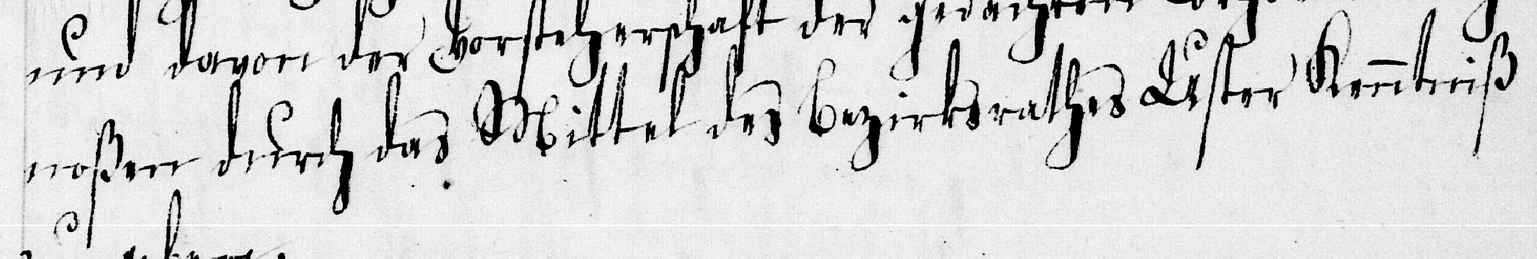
noßen durch das Mittel des Bezirksrathes Uster Kenntniß
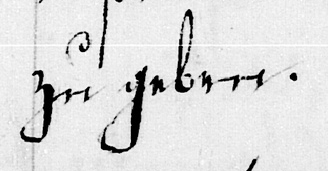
zu geben.
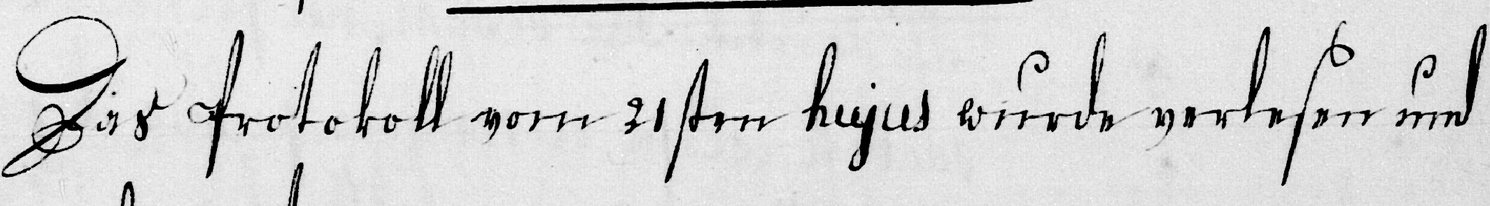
Das Protokoll vom 21ten hujus wurde verlesen und
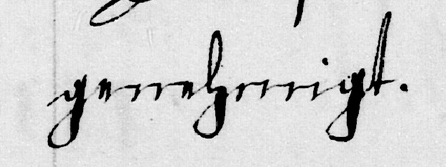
genehmigt.
